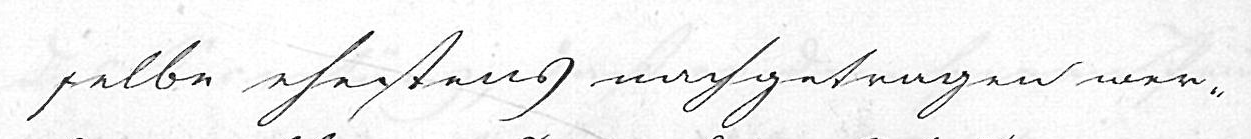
selbe ehestens nachgetragen wer-
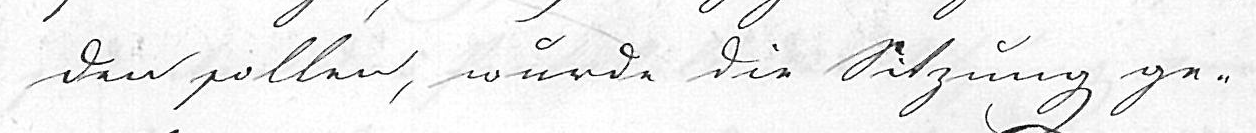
den sollen, wurde die Sitzung ge-
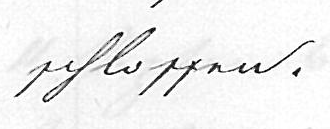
schlossen.
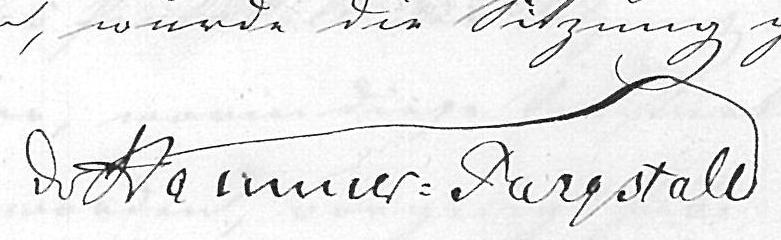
Dr Hammer=Purgstall
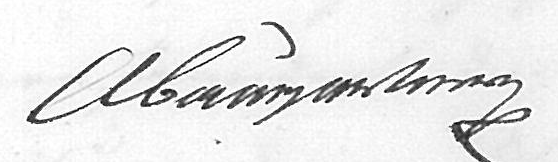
ABaumgartner
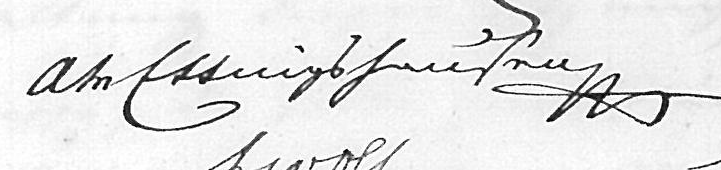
AvEttingshausen
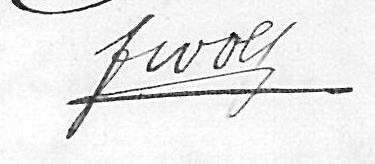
FWolf
